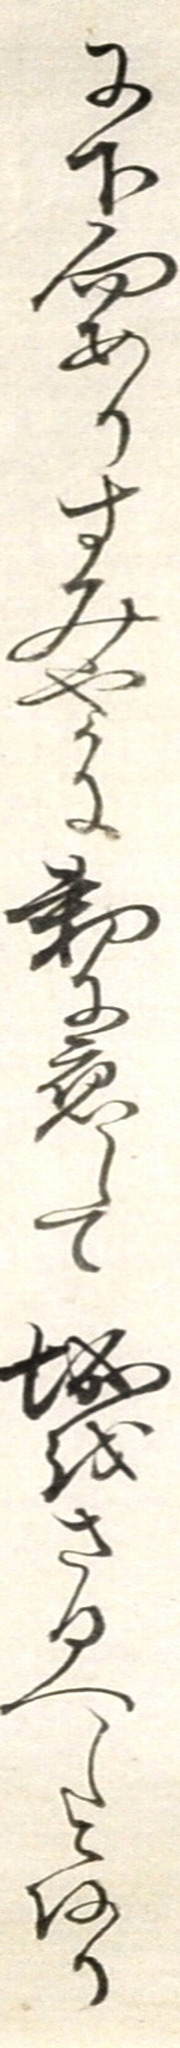に下向ありすみやかに勅に応して城をさるへしとあり
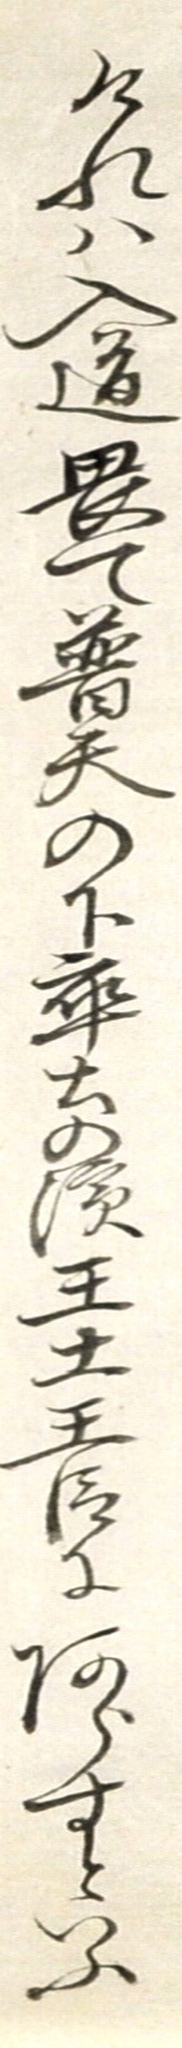けれは入道畏て普天の下卒土の浜王土王臣にあらすといふ
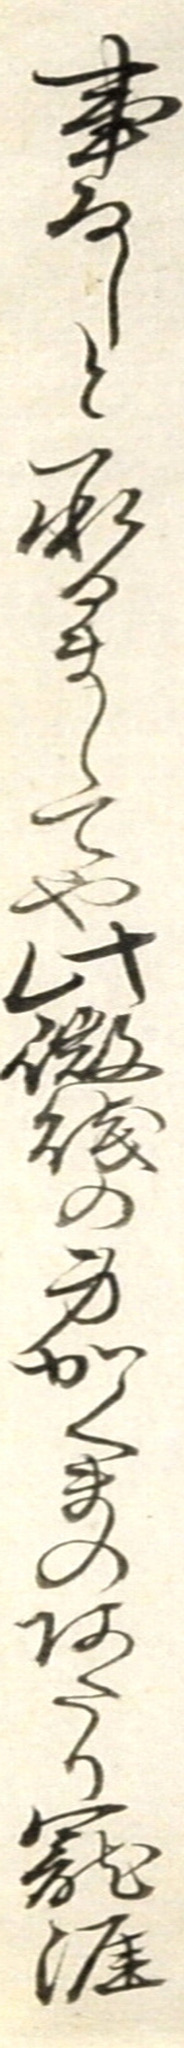事なしと承るましてや此微賤の身かくまのあたり寵涯
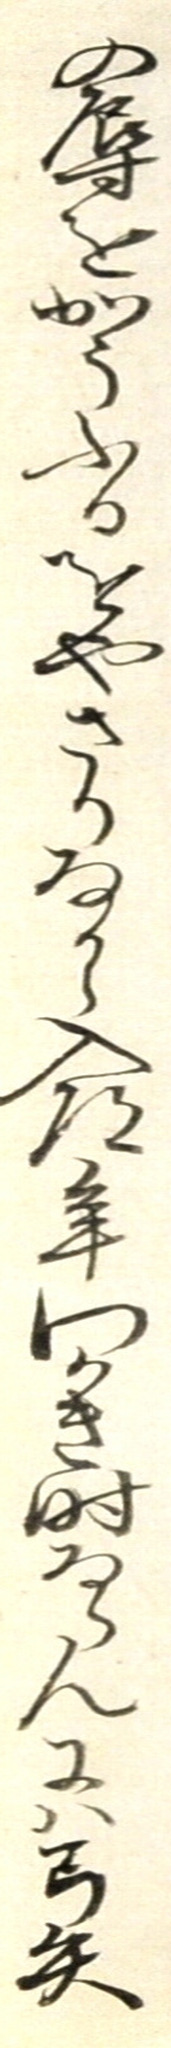の辱をかうふるをやさりなから入道年わかき時ならんには弓矢

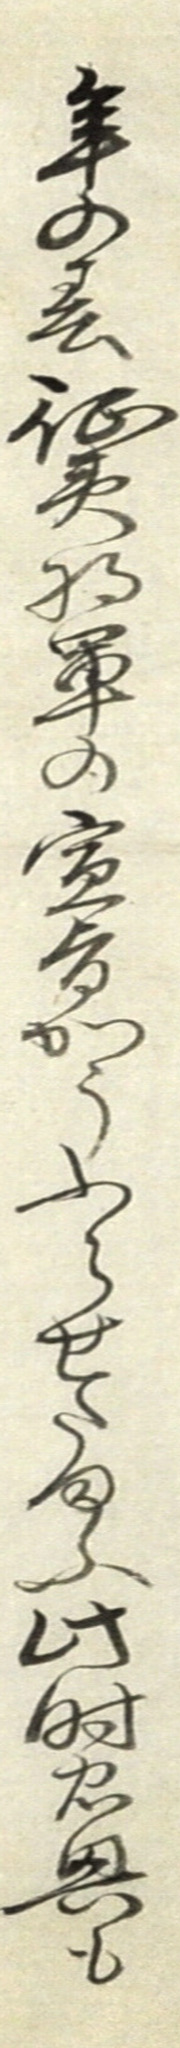年の春征夷将軍の宣旨かうふらせたまふ此時忠興も
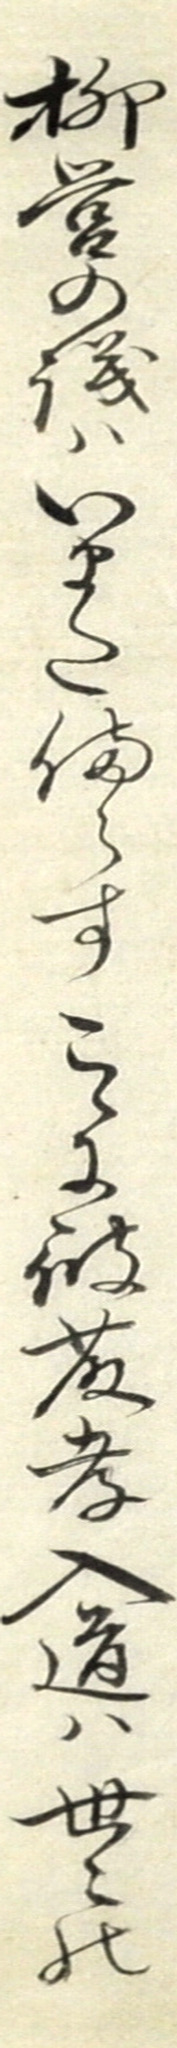柳営の議はいまた備らすこゝに彼藤孝入道は世々の
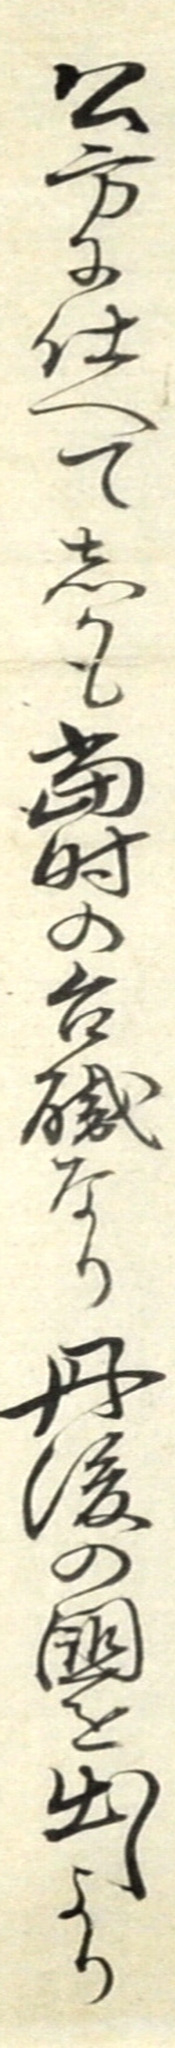公方に仕へてしかも当時の台職なり丹後の国を出しより
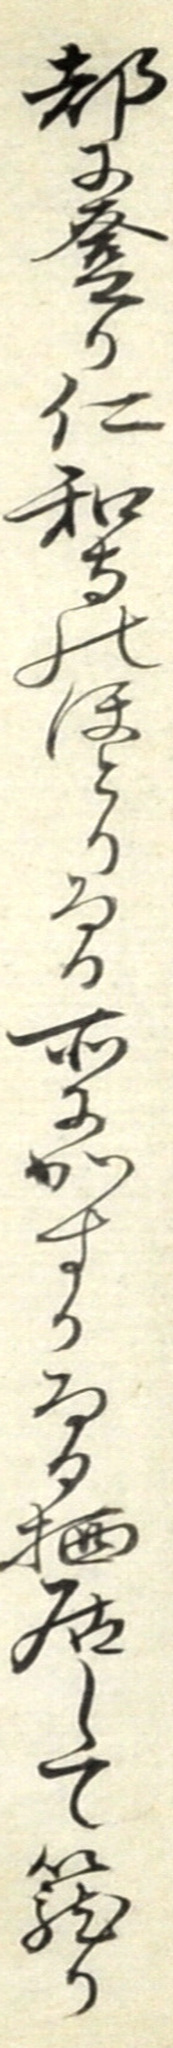都に登り尋仁和寺のほとりなる所にかすかなる栖居して籠り
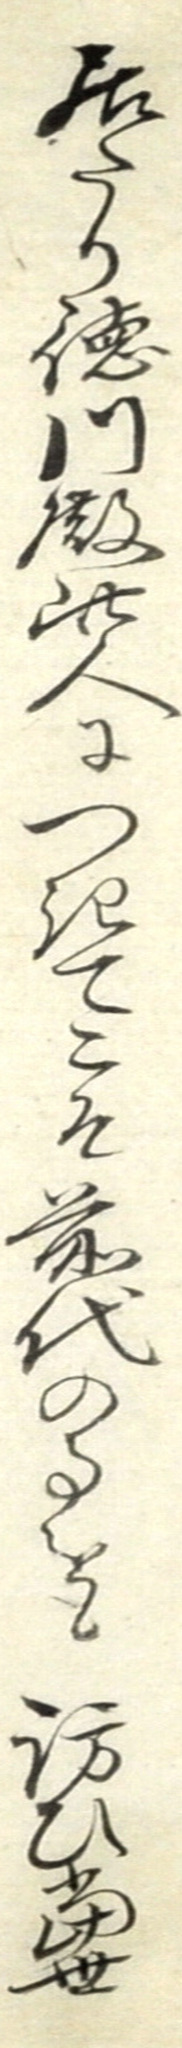居たり徳川殿此人につきてこそ前代の事をも訪ひ当世
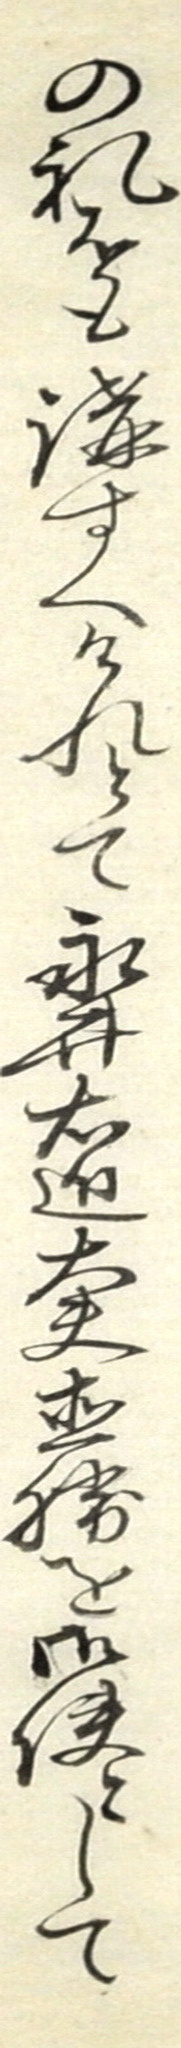の礼をも講すへけれとて永井右近大夫直勝を御使として
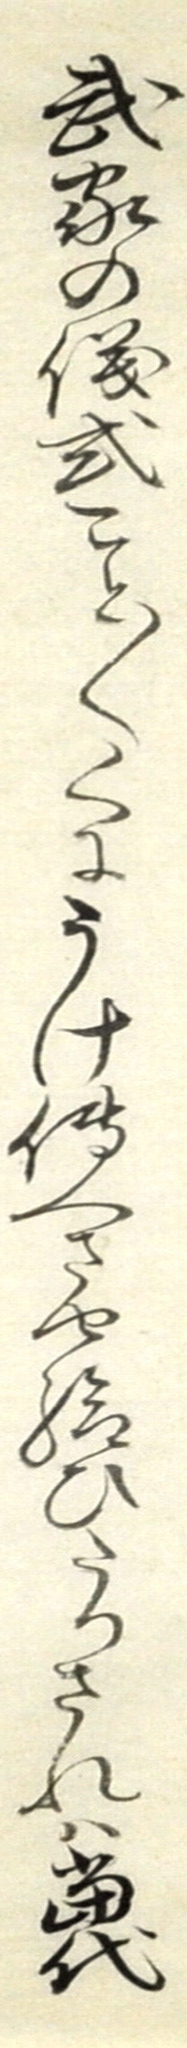武家の儀式こと〳〵くにうけ伝へさせ給ひたりされは当代
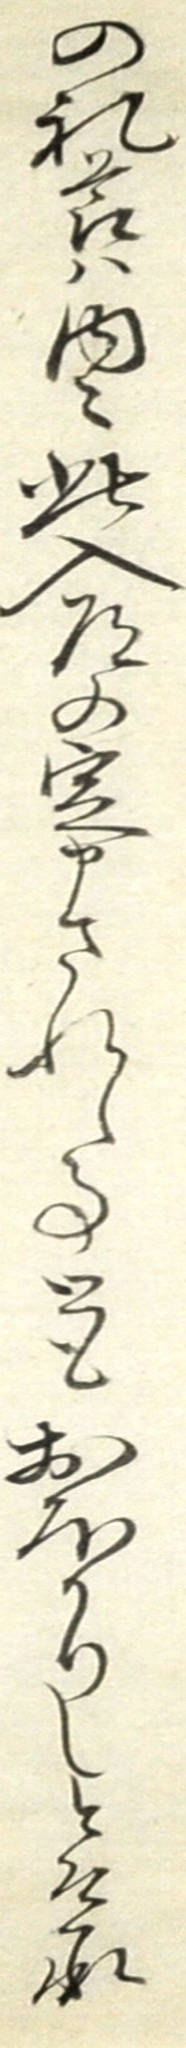の礼節は内々此入道の定申されし事ともおほかりしとそ承
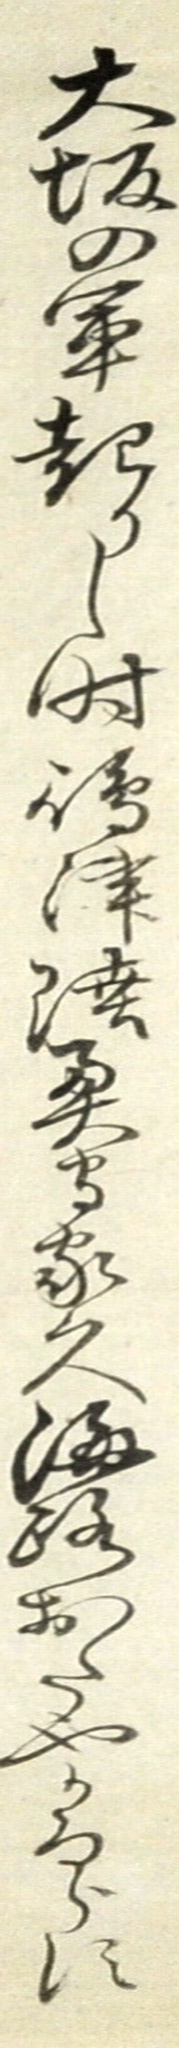大坂の軍起りし時島津陸奥守家久海路おたやかならす
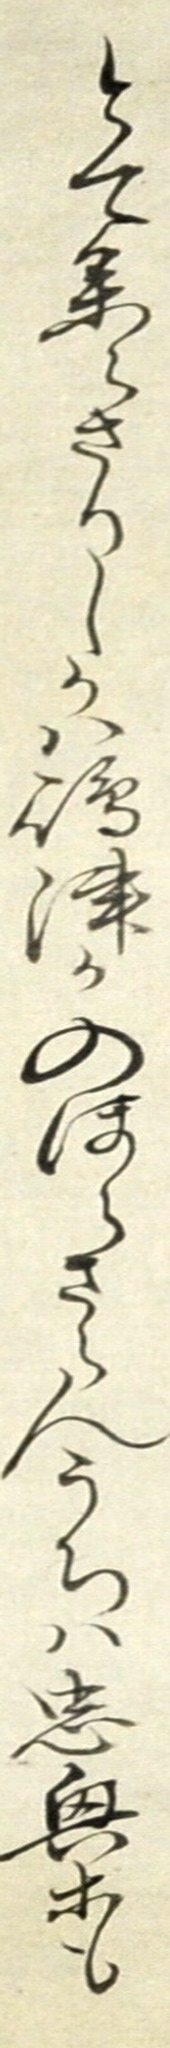とて参らさりしかは島津かのほらさらんうちは忠興等も
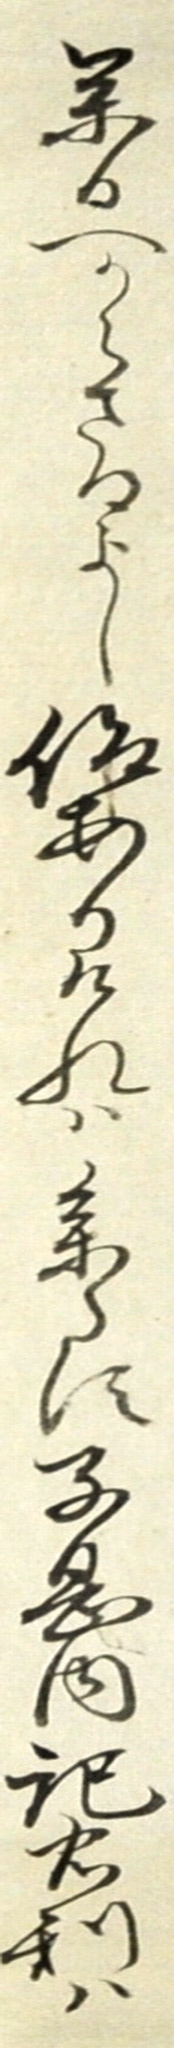参るへからさるよし仰ありけれは参らす子息内記忠利は
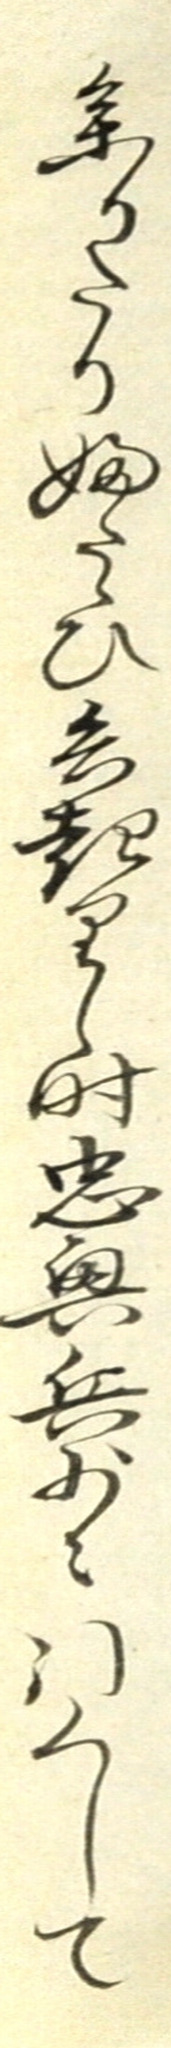参りたりふたゝひ兵起りし時忠興兵少々引くして
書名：藩翰譜（七・下）
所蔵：伊那市立高遠町図書館・合同会社AMANE
